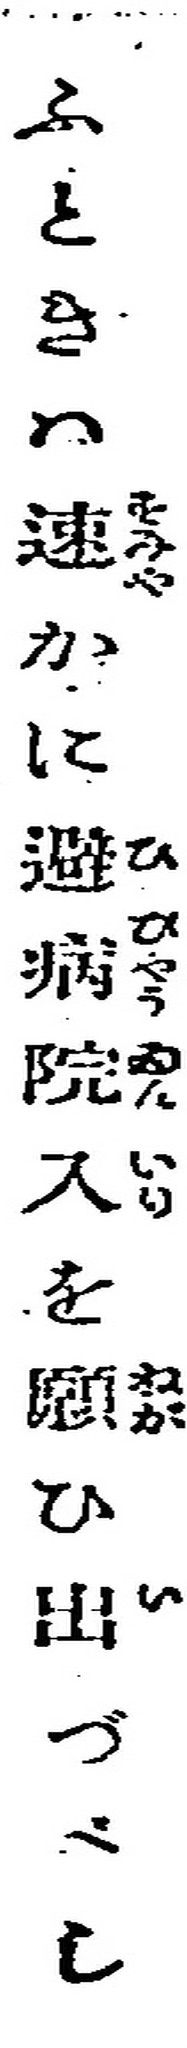ふときは速かに避病院入を願ひ出づべし
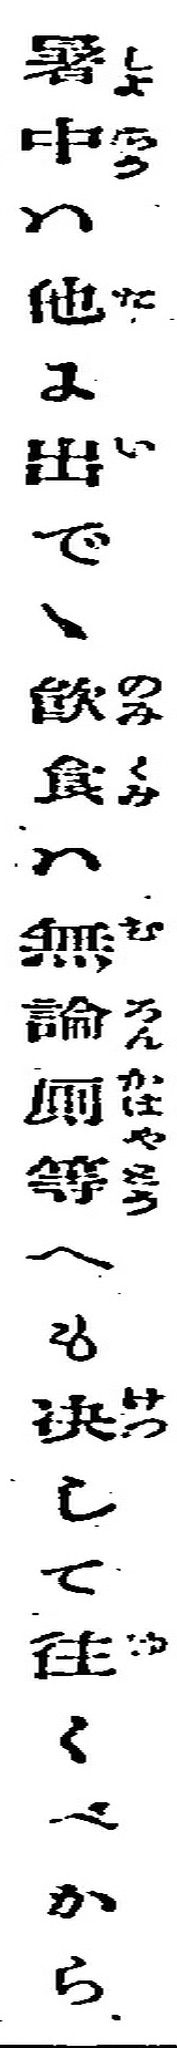暑中は他に出でゝ飲食は無論厠等へも決して往くべから
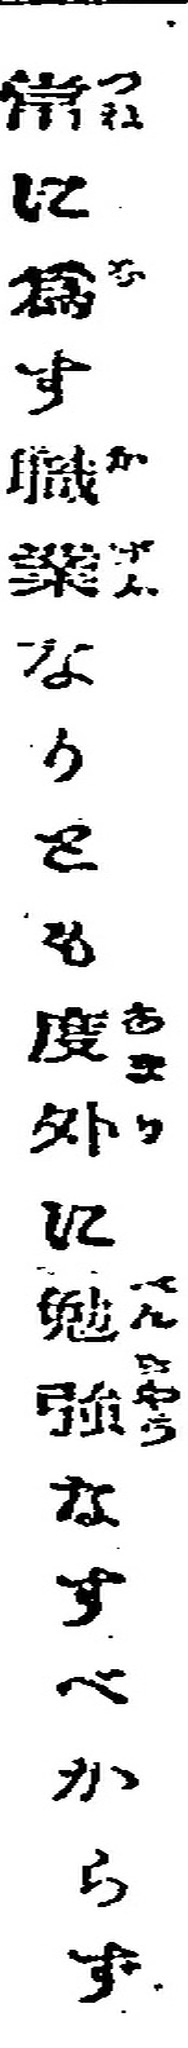常に為す職業なりとも度外に勉強なすべからず

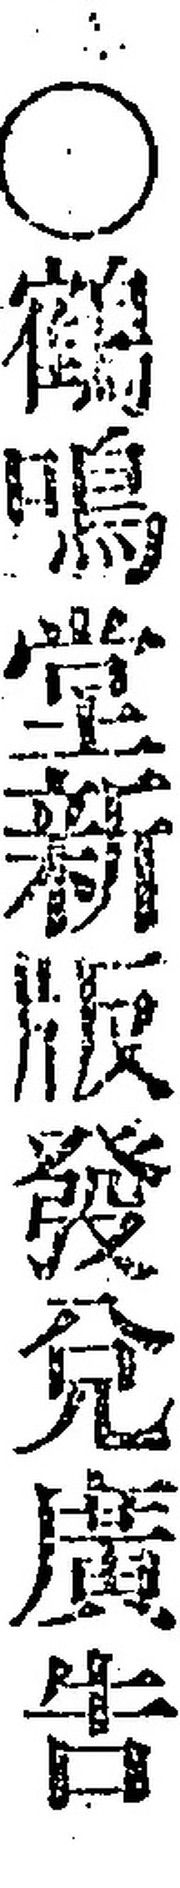〇鶴鳴堂新版發兌廣告
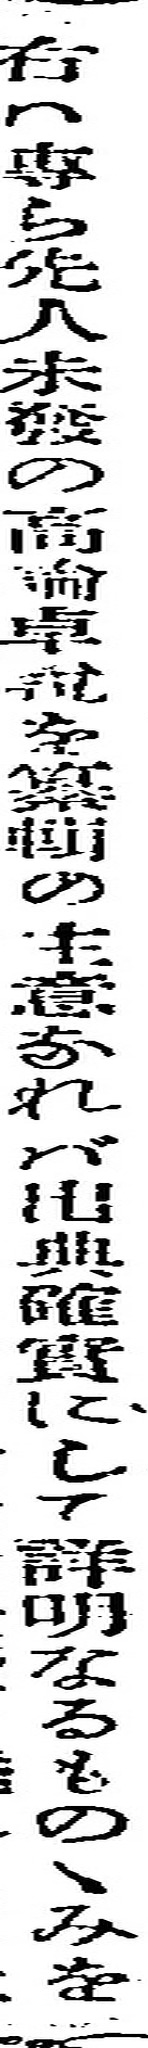右は専ら先人未發の高論卓説を纂輯の主意なれば出典確実にして鮮明なるものゝみを
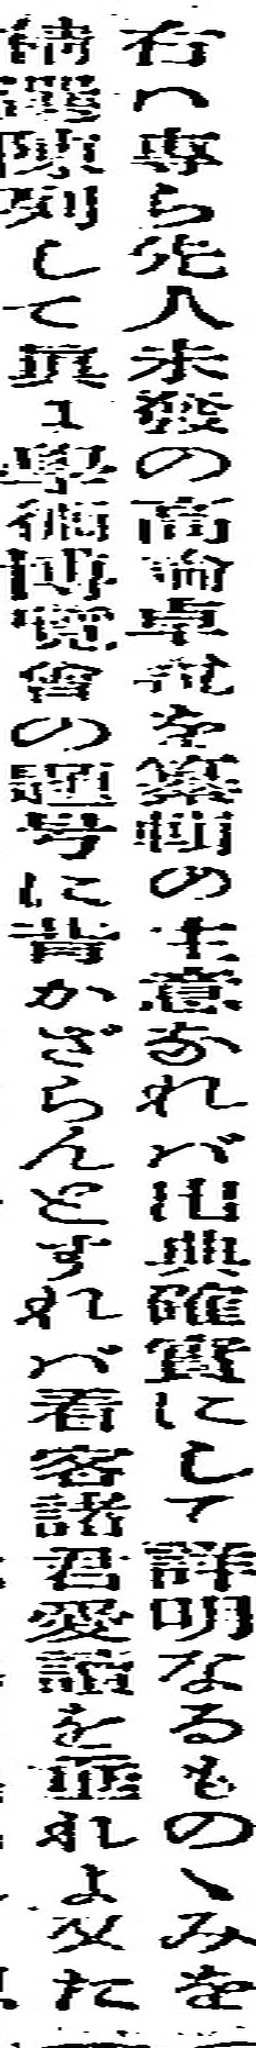精選陳列して真に學術博覧會の題号に背からざんとすれば看客諸君愛讀を垂れよ又た
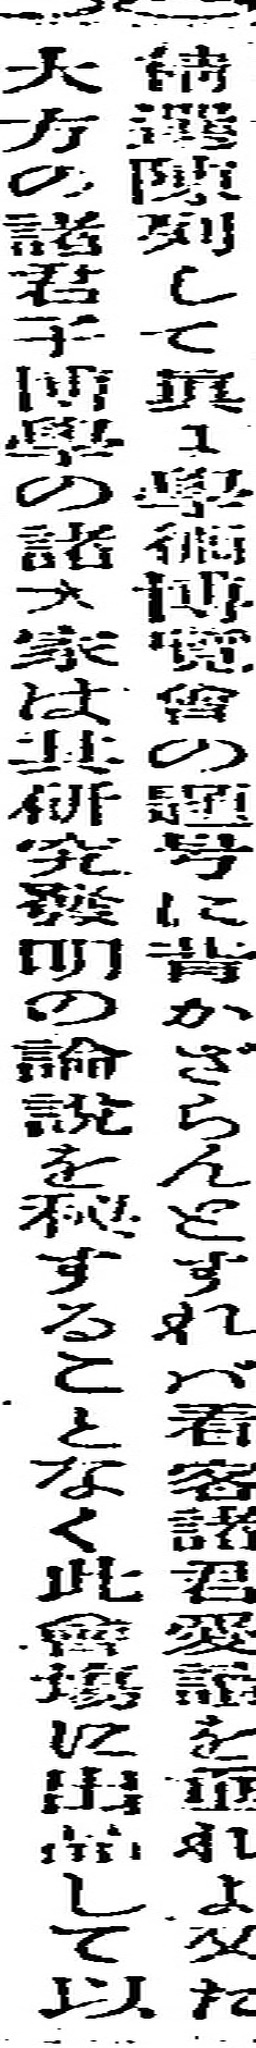大方の諸君子博学の諸大家は其研究発明の論説を秘することなく此会場に出品して以
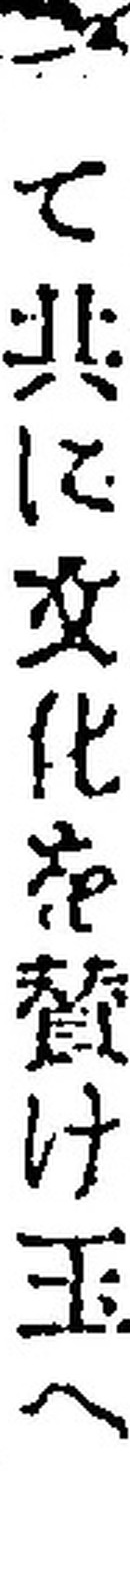て共に文化を賛け玉へ
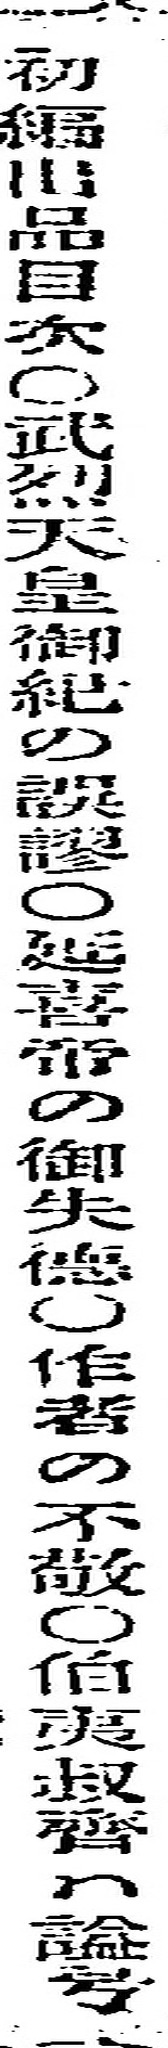初編出品目次〇武烈天皇御紀の誤謬〇延喜帝の御失徳〇作者の不敬〇伯夷叔齊は謚号
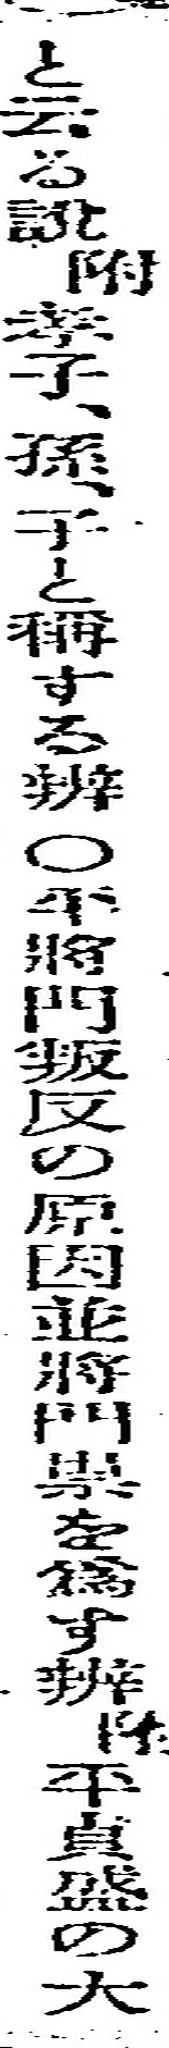と云る説附孝子、孫、子と稱する辨〇平将門叛反の原因並将門祟を為す辨附平貞盛の大
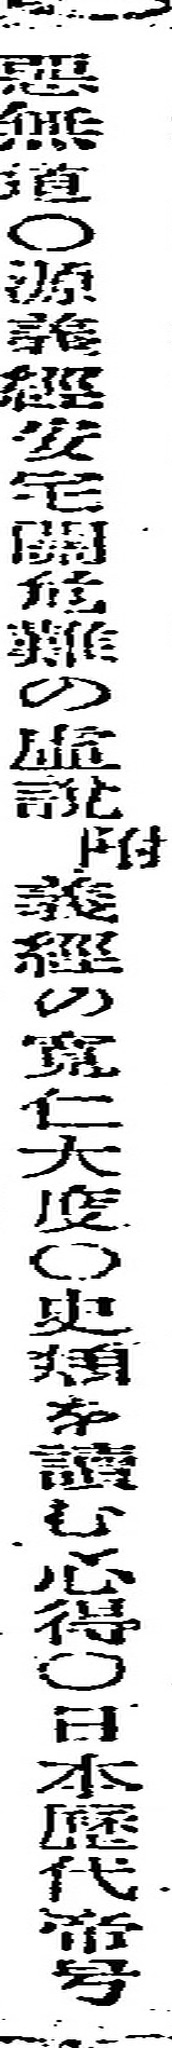悪無道〇源義経安宅関危難の虚説附義経の寛仁大度〇史類を読む心得〇日本歴代帝号
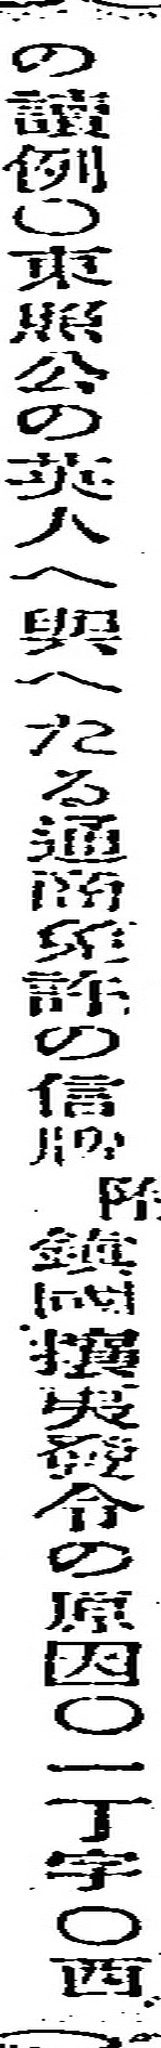の読例〇東照公の英人へ與へたる通商免許の信牌附鎮國攘夷発令の原因〇一丁字〇西
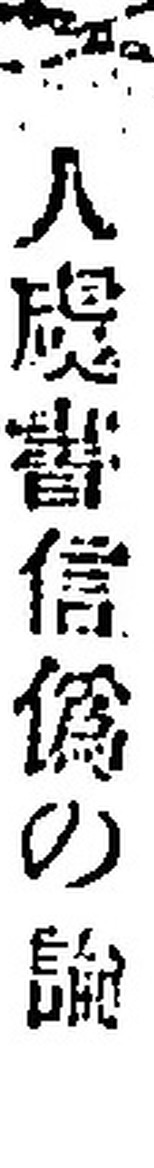人虞書信偽の論
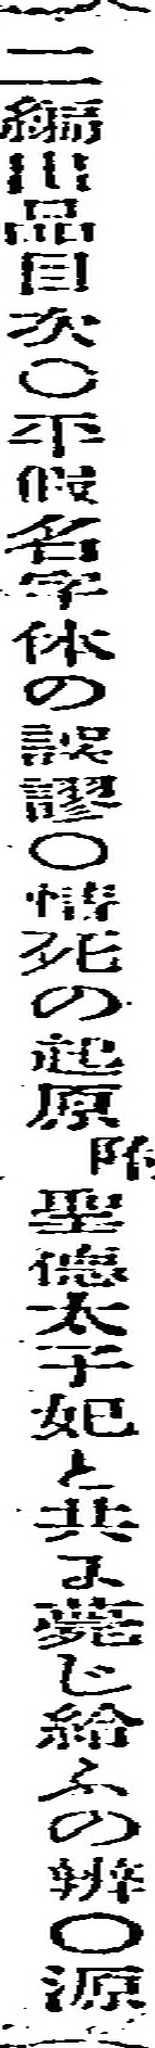二編出品目次〇平假名字体の誤謬〇情死の起源附聖徳太子妃と共に斃じ給ふの辨〇源
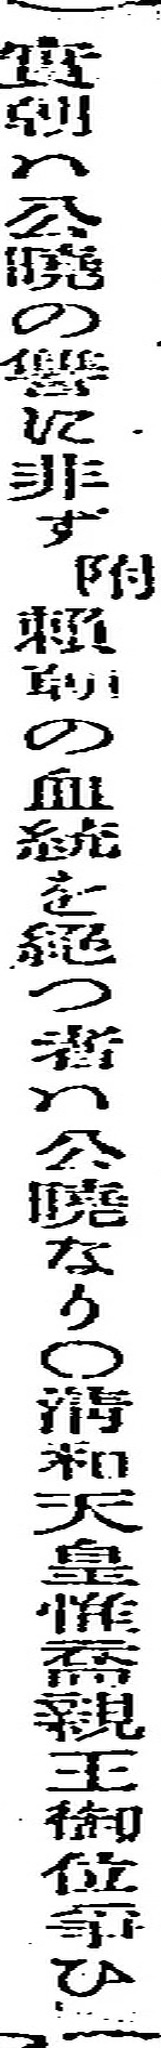実朝は公暁の讐に非ず附頼朝の血統を絶つ者は公暁なり〇清和天皇惟喬親王御位争ひ
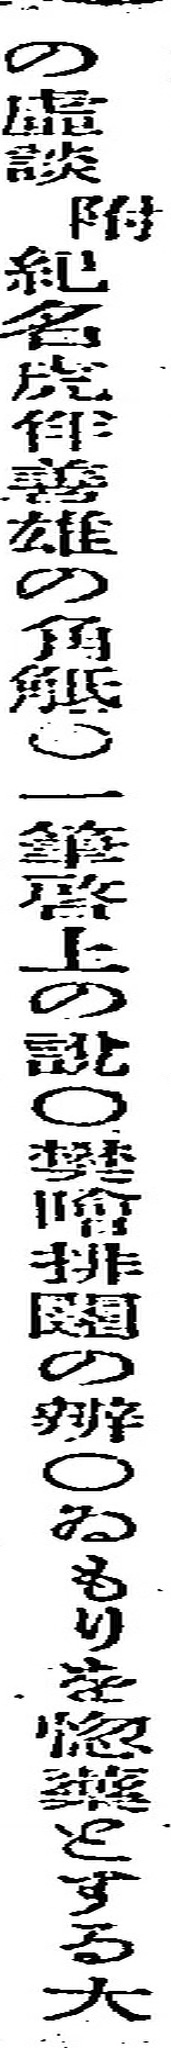の虚談附紀名虎伴善雄の角觝〇一筆啓上の説〇樊膾排闥の辨〇ゐもりを惚藥とする大
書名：新撰暑中養生法 : 附・コレラ予防歌
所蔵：国立国会図書館 National Diet Library, JAPAN
